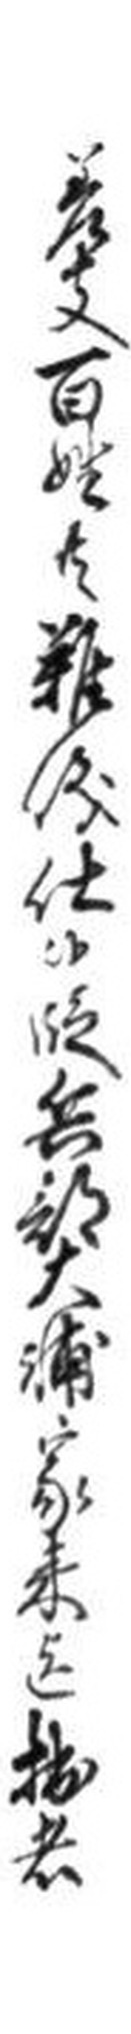差支百姓共難儀仕候段兵部大輔家来迄拙者
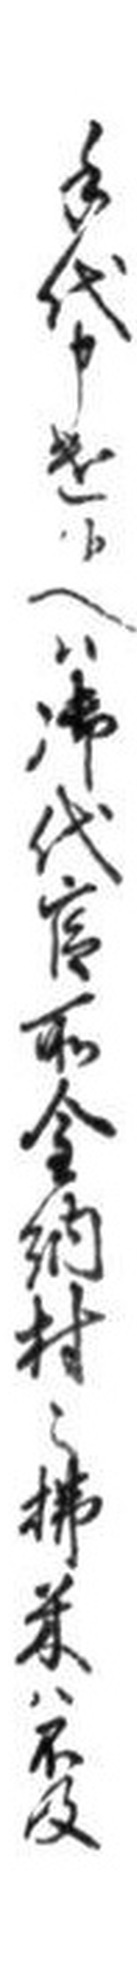手代申遣候ヘハ御代官所金納村々払米ハ不及
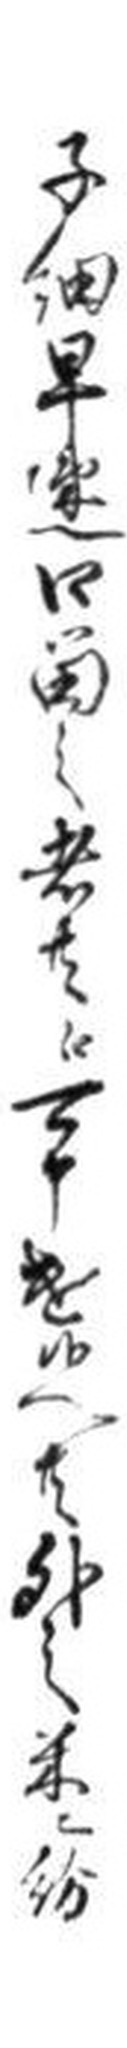子細早速口留之者共江可申遣候へ共外之米ニ紛
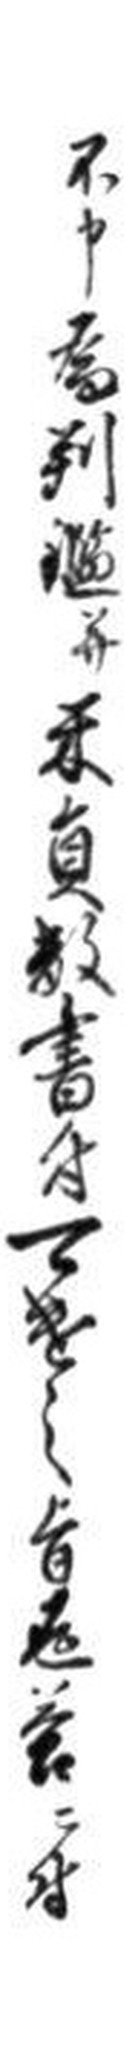不申為判鑑并米員数書付可遣之旨返答ニ付
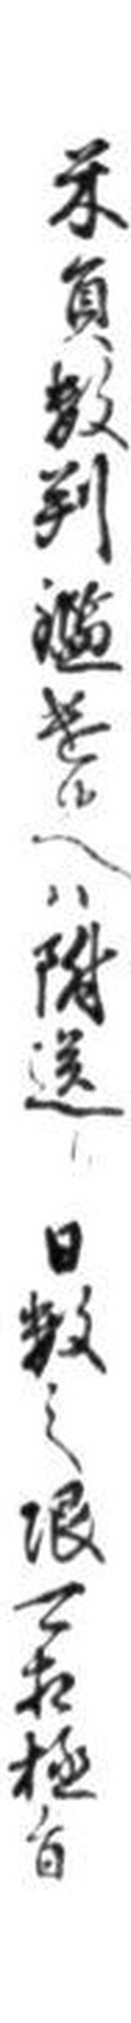米員数判鑑遣候ヘハ付送り日数之限可相極旨
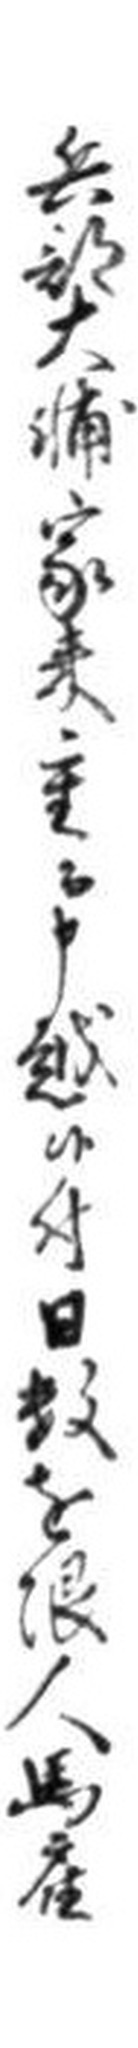兵部大輔家来重而申越候付日数を限人馬雇
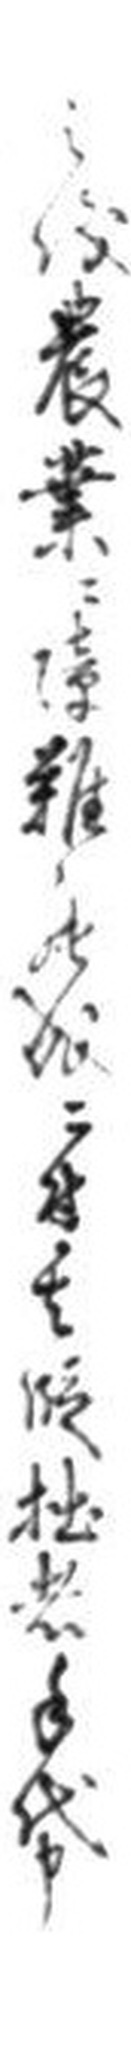之儀農業ニ障難罷成ニ付其段拙者手代申
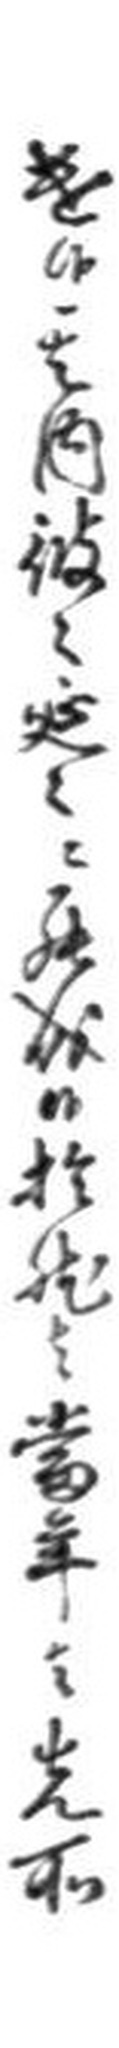遣候其内彼々延々ニ罷成候於然者当年者先所
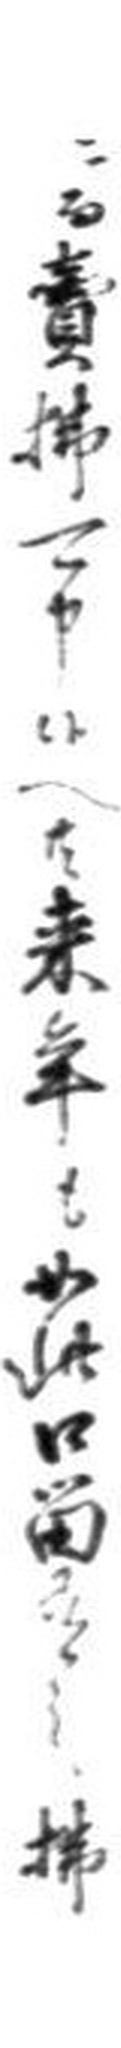ニ而売払可申候へ共来年も如此口留有之払
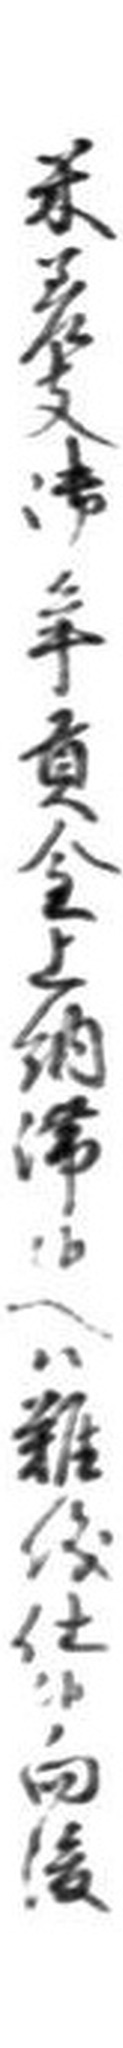米差支御年貢金上納滞候ヘハ難儀仕候向後
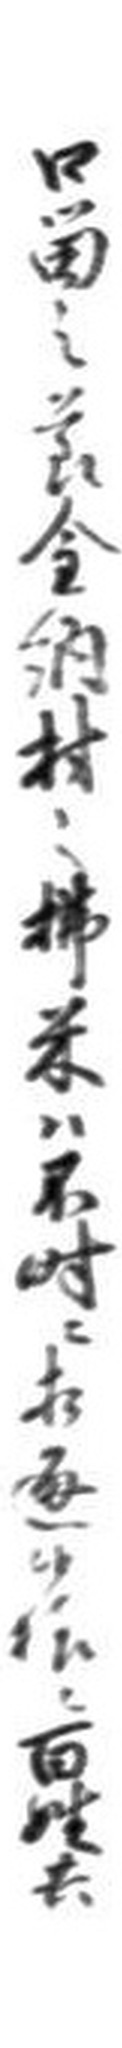口留之節金納村々払米ハ不時ニ相通候様ニ百姓共
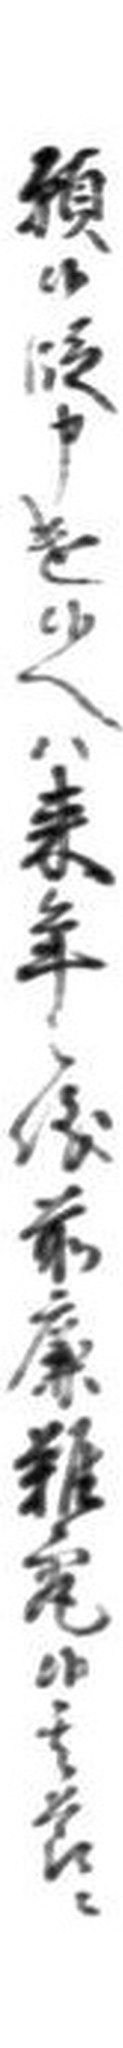願候段申遣候ヘハ来年之儀前廉難究候其節ニ
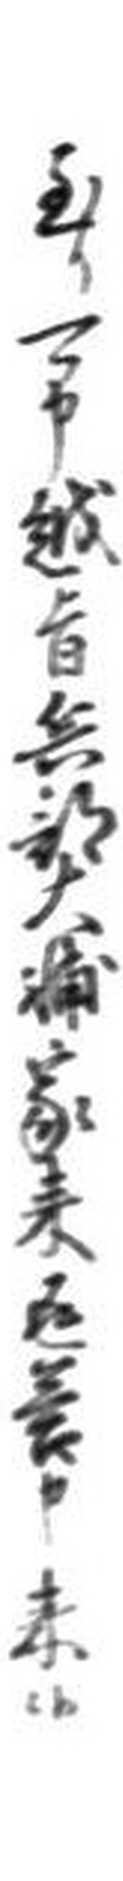至り可申越旨兵部大輔家来返答申来候
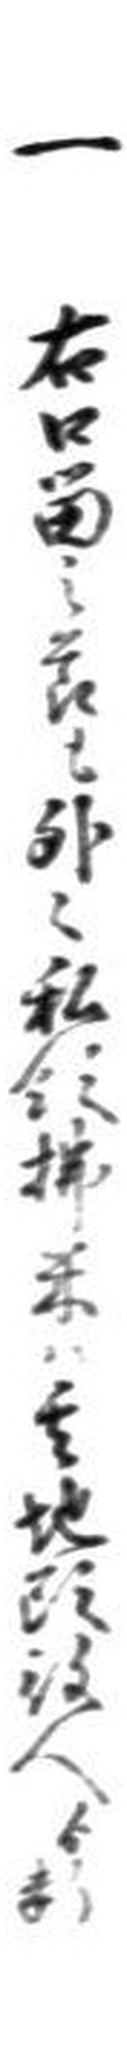一右口留之節も外々私領払米ハ其地頭役人ゟ断
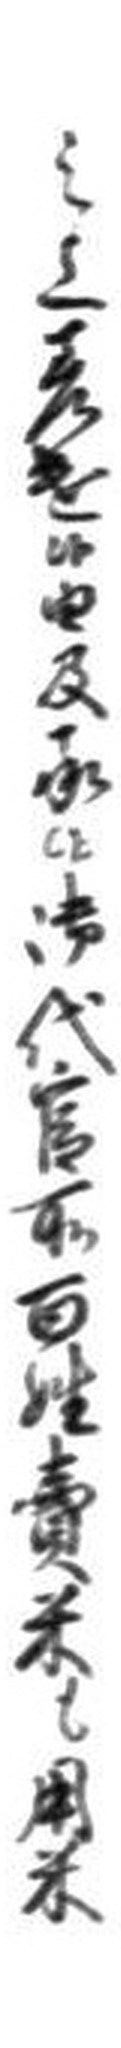之上差遣候由及承候御代官所百姓売米も用米
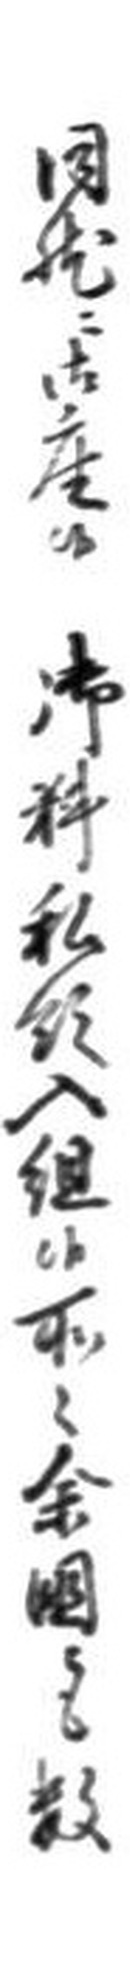同然ニ御座候御料私領入組候所々余国ニも数
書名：家譜 二十二 吉品公 従元禄十五年到同十六年
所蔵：福井県文書館 Fukui Prefectural Archives
